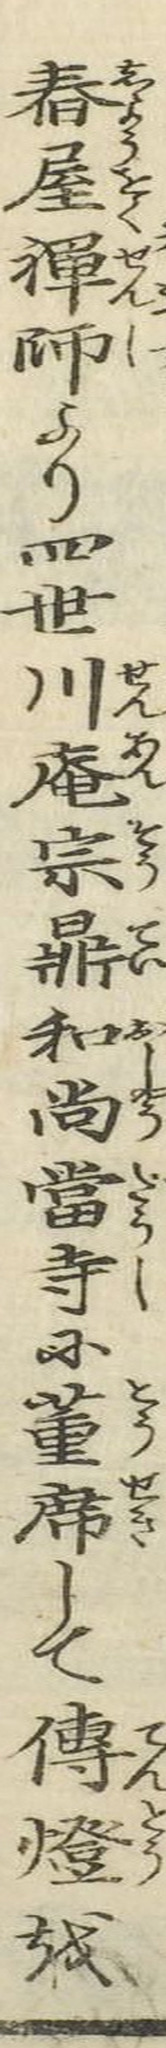舂屋禅師より四世川庵宗鼎和尚当寺に董席して伝灯を
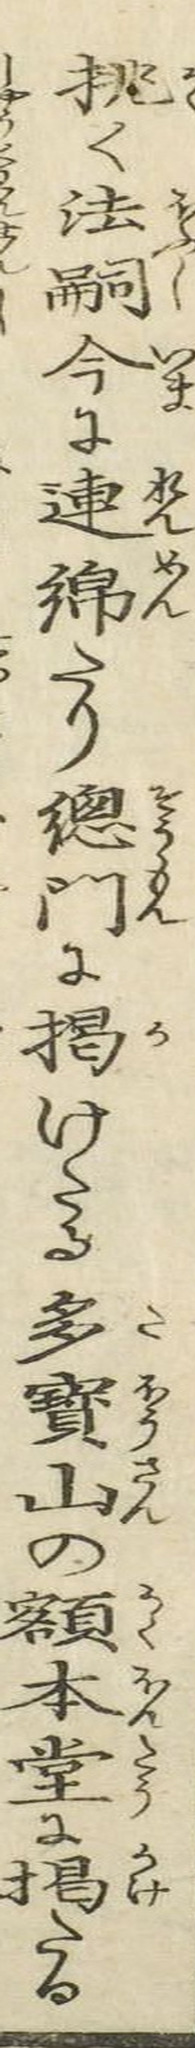挑く法嗣今に連綿たり総門に掲けたる多宝山の額本堂に掲たる
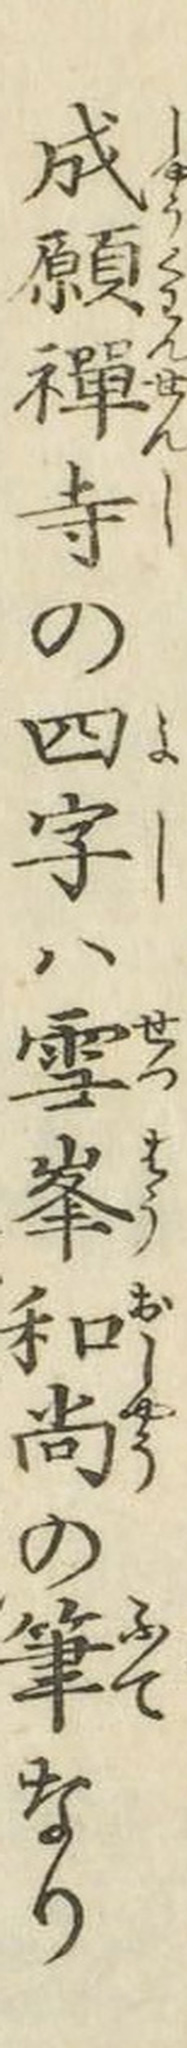成願禅寺の四字は雪峯和尚の筆なり
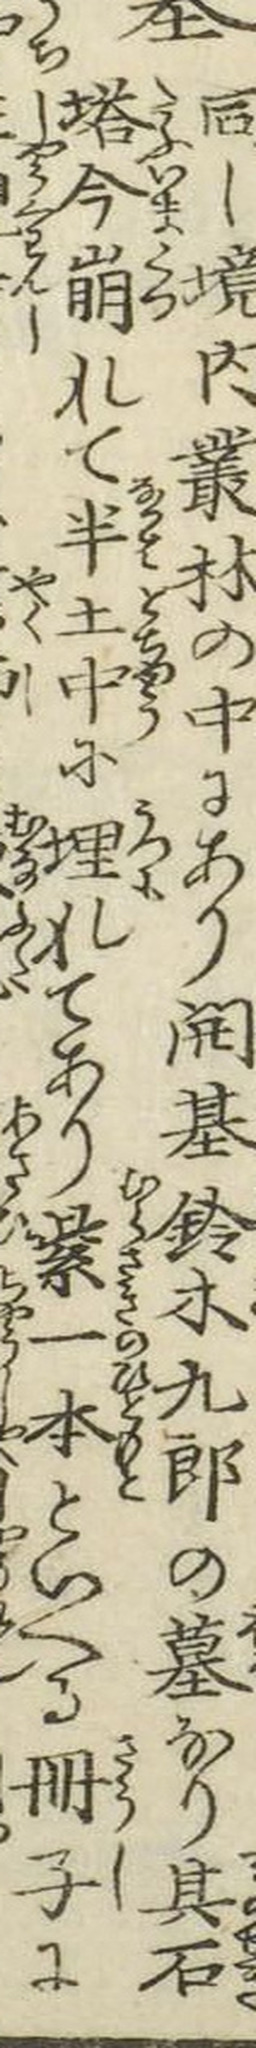塔今崩れて半土中に埋れてあり紫一本といへる冊子に
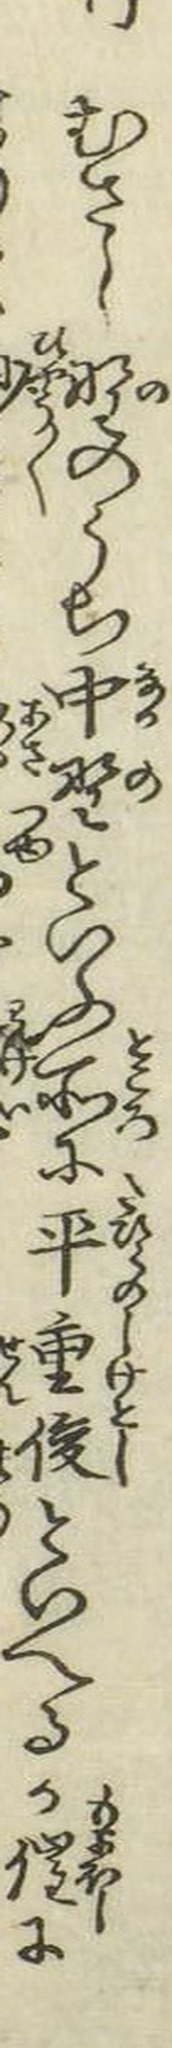北国記行むさし野のうち中野といふ所に平重俊といへるか催に
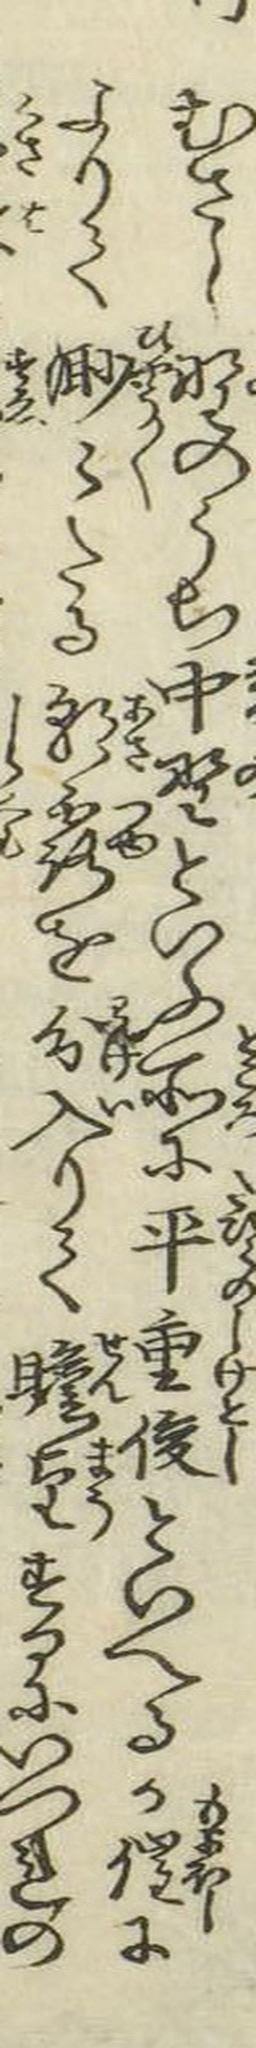よりて渺々たる朝露を分入りて瞻望するにいつれの
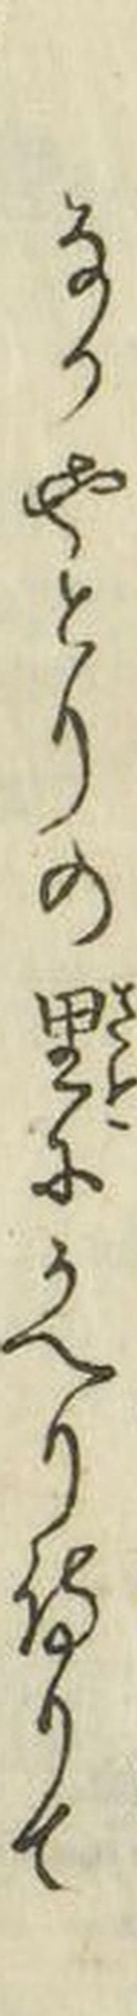なかやとりの里にかへり侍りて
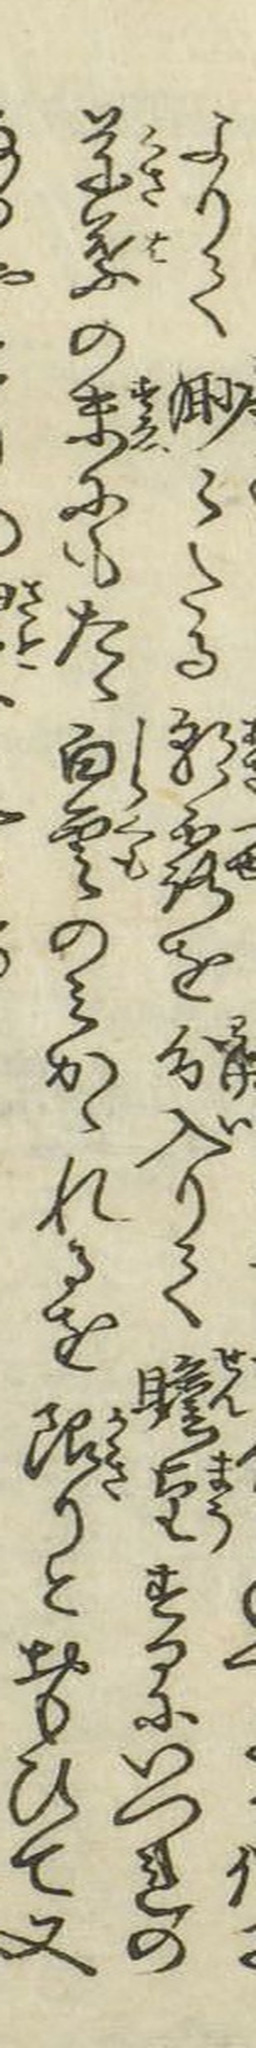草葉の末にもたゝ白雲のみかゝれるを限りとおもひて又
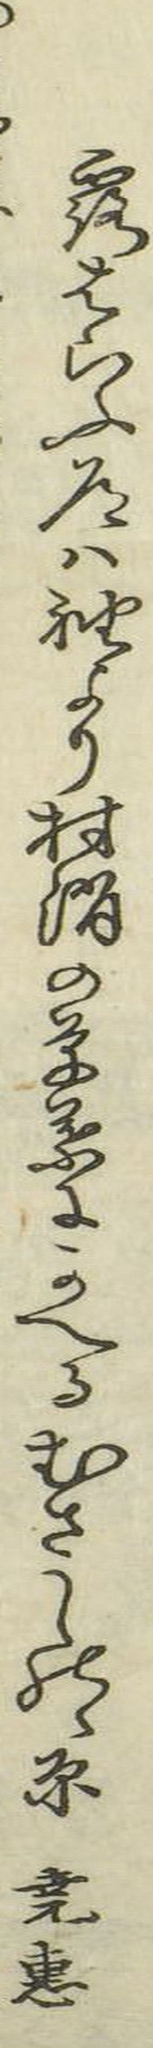露はらふ道は袖より村消の草葉にかへるむさしのゝ原堯恵
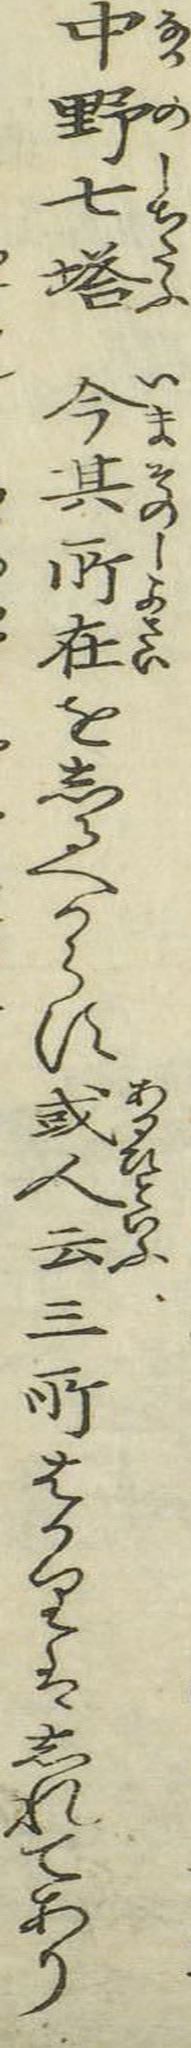中野七塔今其所在をしるへからす或人云三所はかりはしれてあり
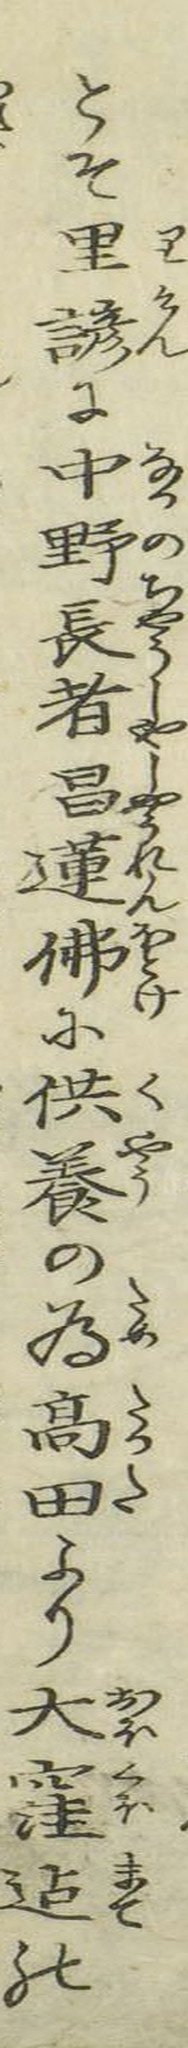とそ里諺に中野長者昌蓮仏に供養の為高田より大窪迄の

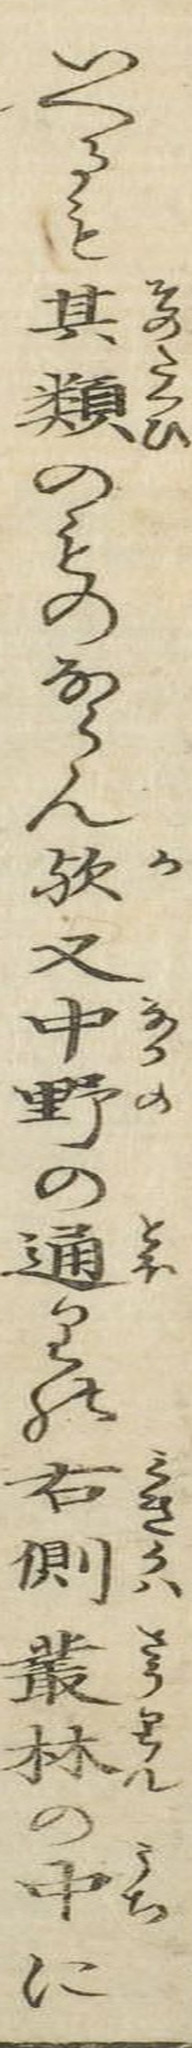いへるも其類のものならん歟又中野の通りの右側叢林の中に
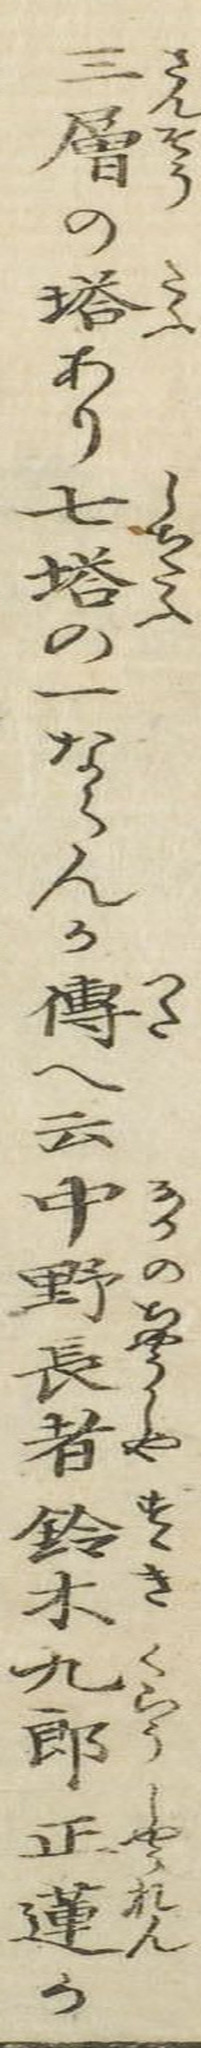三層の塔あり七塔の一ならんか伝へ云中野長者鈴木九郎正蓮か
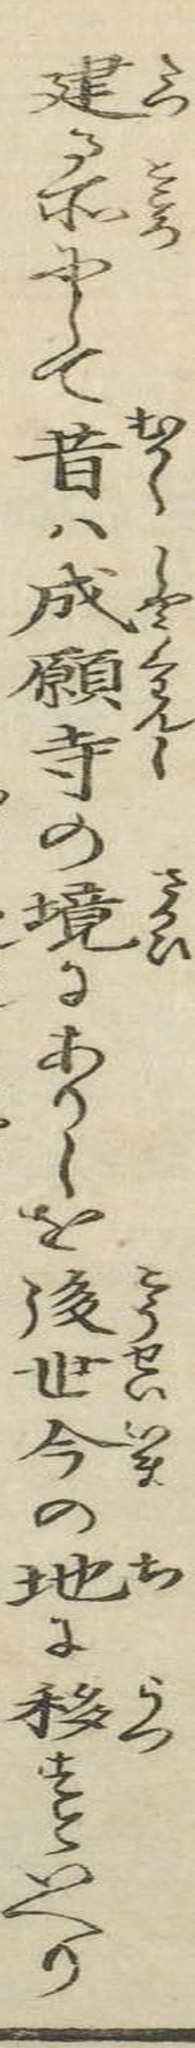建る所にして昔は成願寺の境にありしを後世今の地に移すといへり
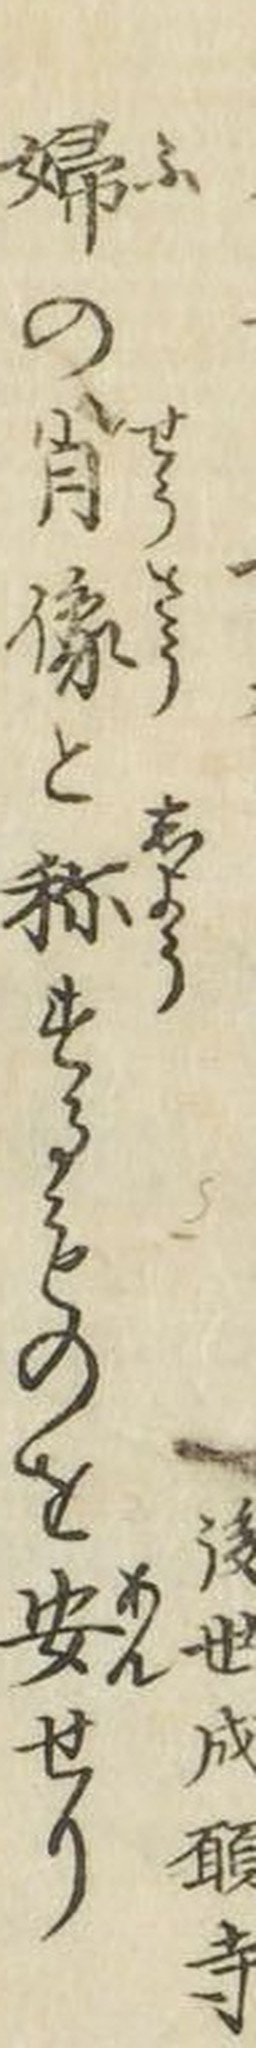婦の肖像と称するものを安せり
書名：江戸名所図会 20巻 巻之11
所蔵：東京学芸大学教育コンテンツアーカイブ
